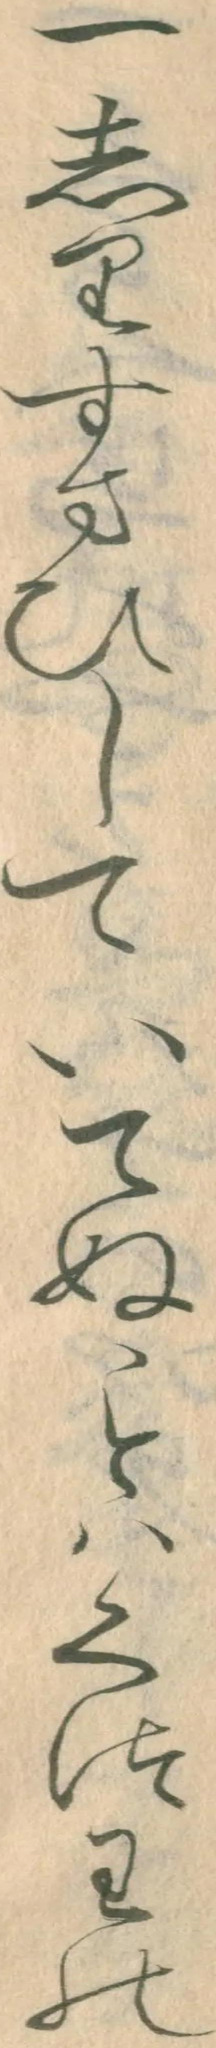一しりすまひしていてぬことはくつわの
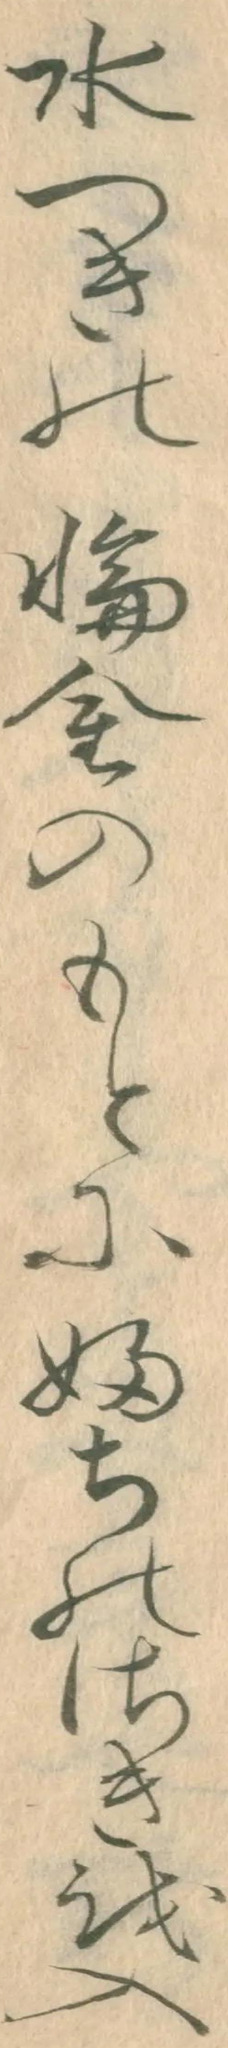水つきの輪金のもとにふちのさきを入
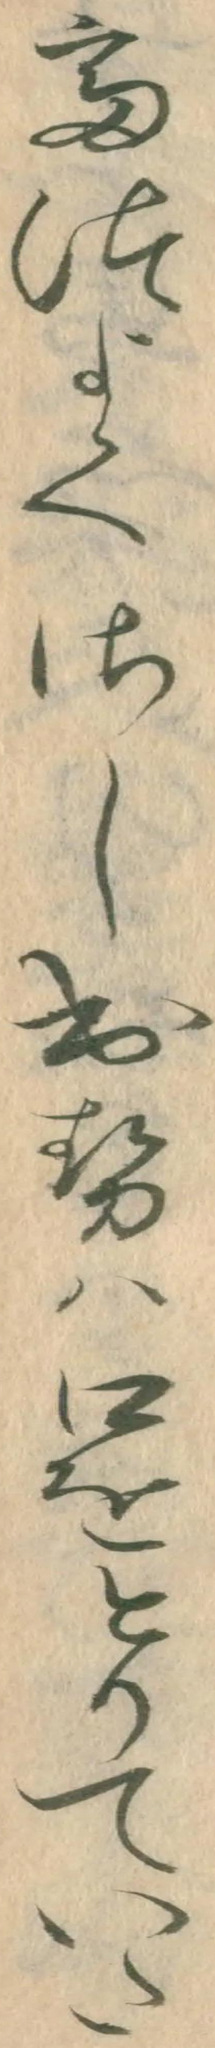てつよくさし出せは口をとりていた

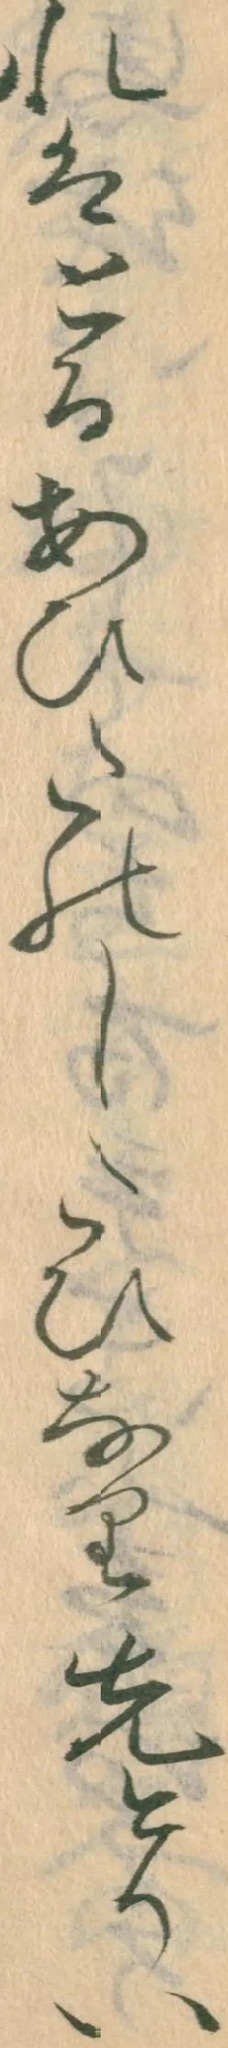れはとるあひたのしたひなり先とりい
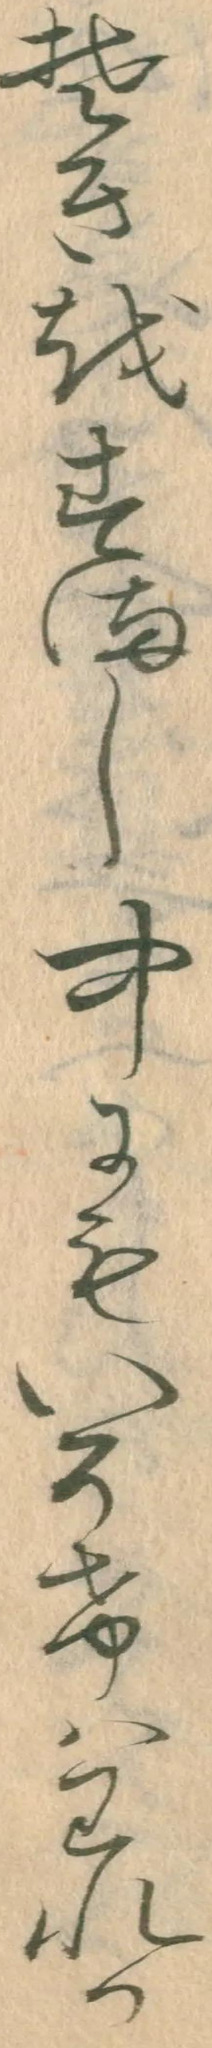そきをすまし中にもいそけはわれか
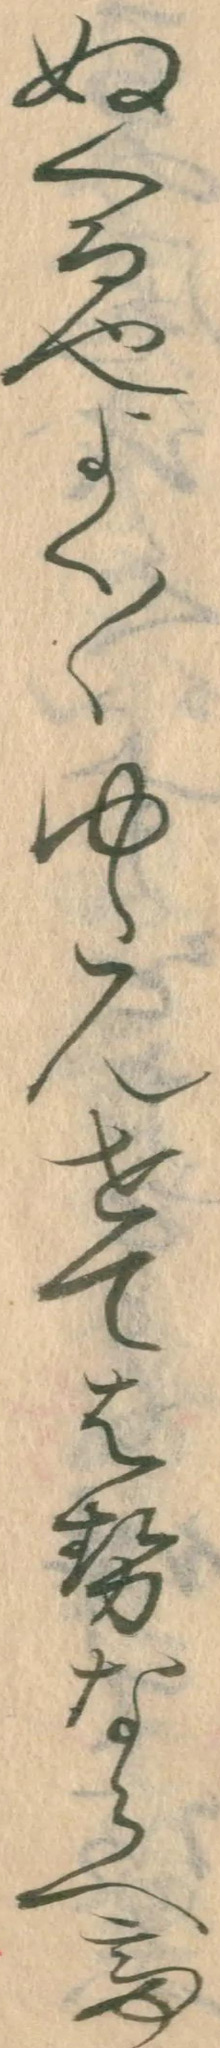ぬくる也よくゆたんせてはせならへて
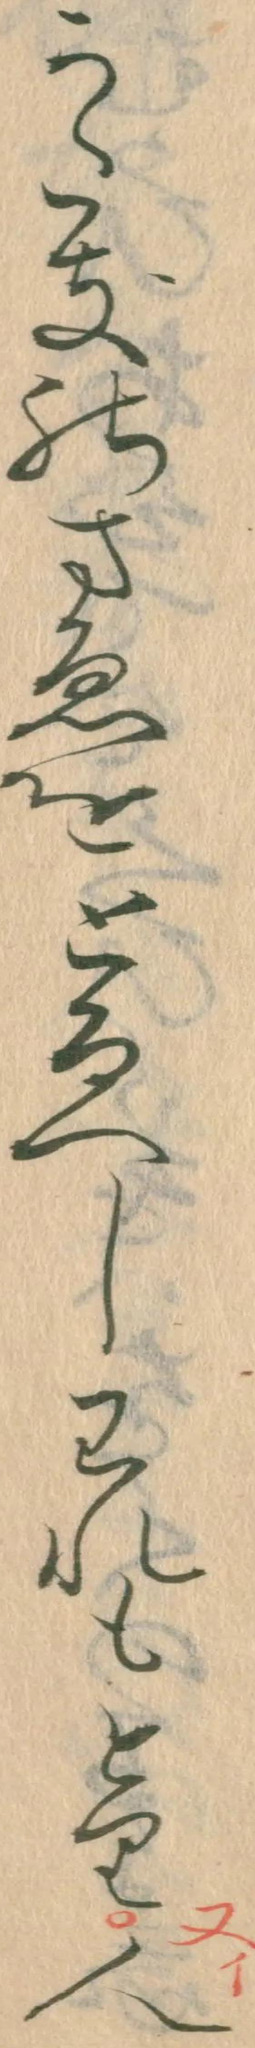かたきのまゑをとるへしわれもとり◦人
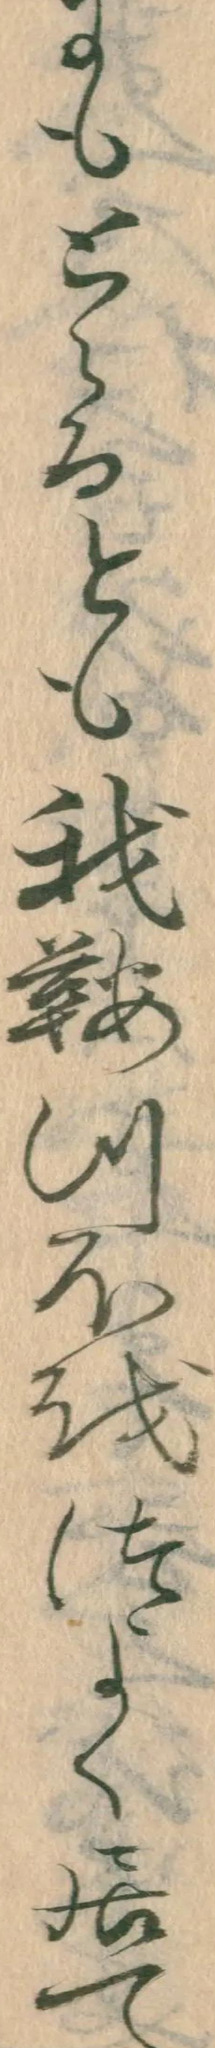にもとらるとも我鞍つほをつよく居て
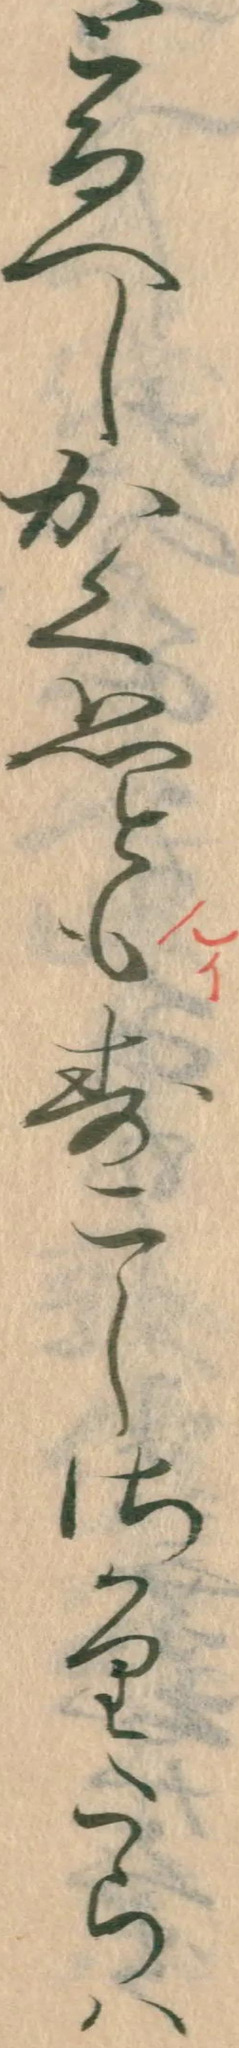とるへしかく思ともすこしさかりたらは
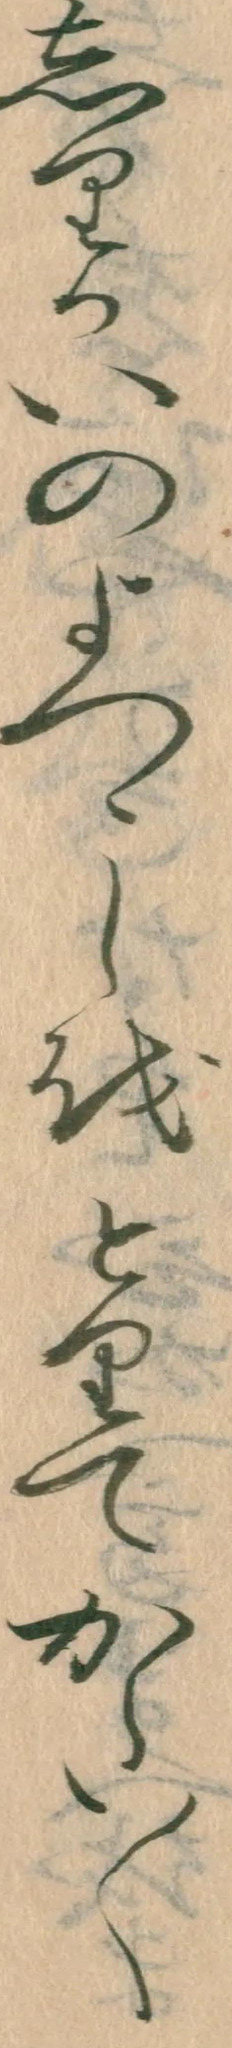しりかいのよつゝしをとりてかた〳〵
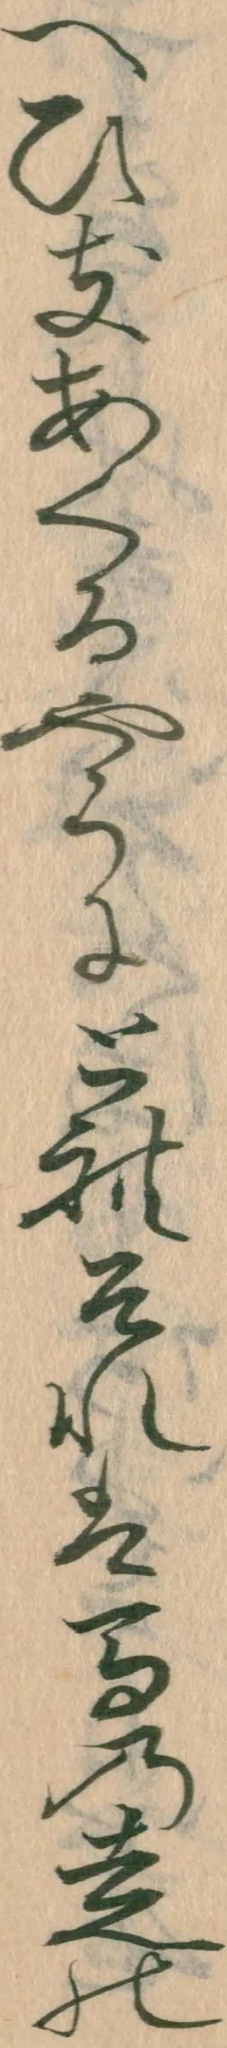へひきあくるやうにとれそれは馬の走の
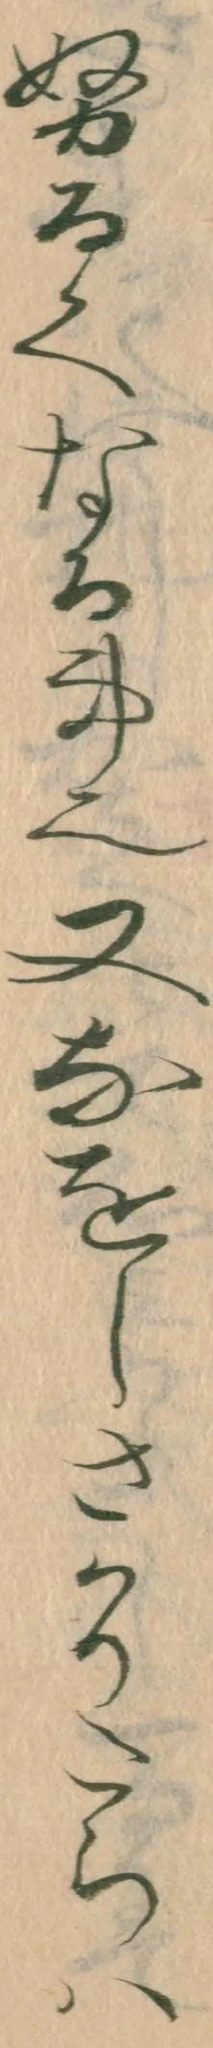ぬるくなる事也又なをしさかりたらは
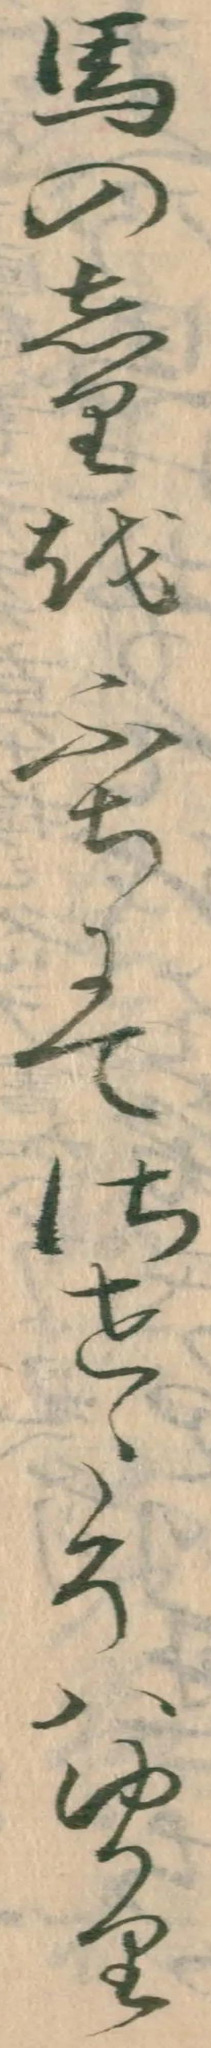馬のしりをふちにてさせこそはゆかり
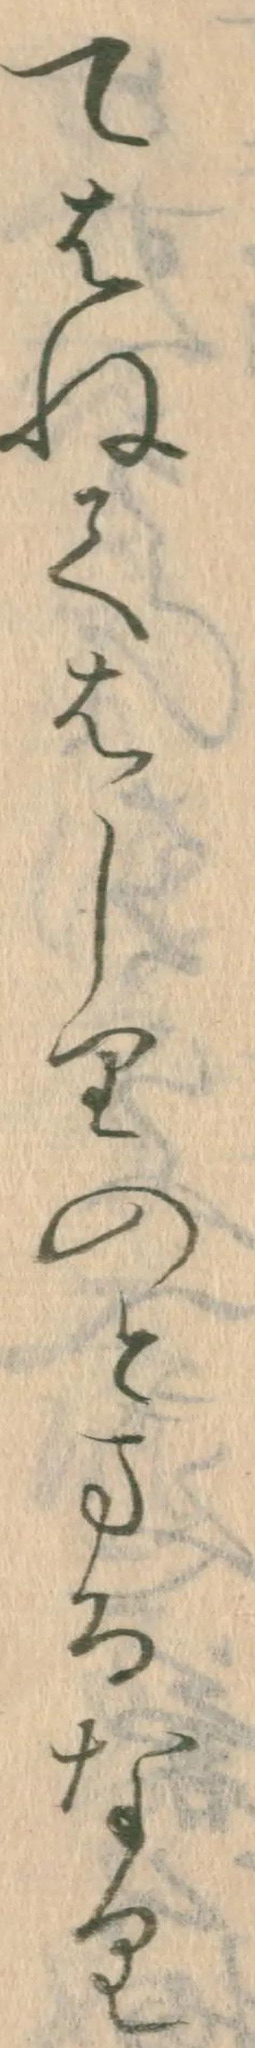てはねてはしりのとまるなり
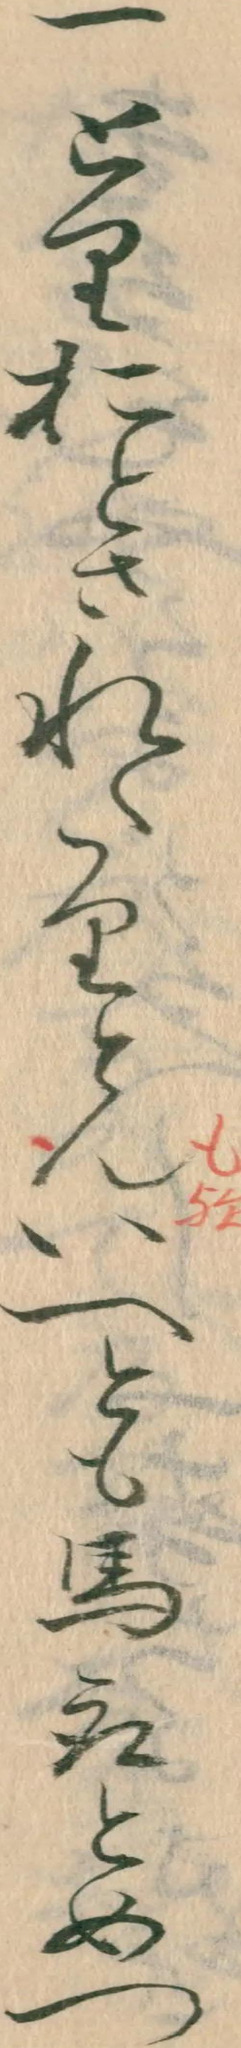一とりおとされたりとんいへとも馬取とめつ
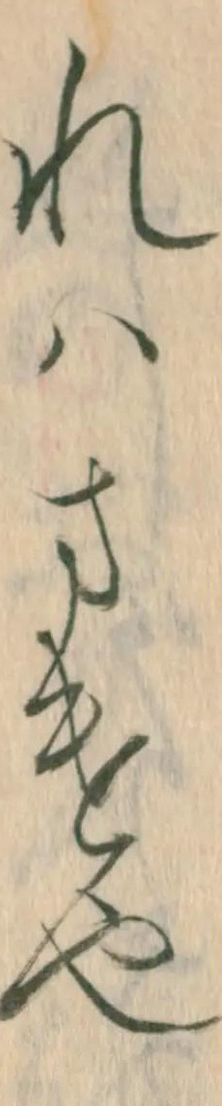れはまけ也
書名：賀茂社記録. 第13冊
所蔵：国立国会図書館 National Diet Library, JAPAN
